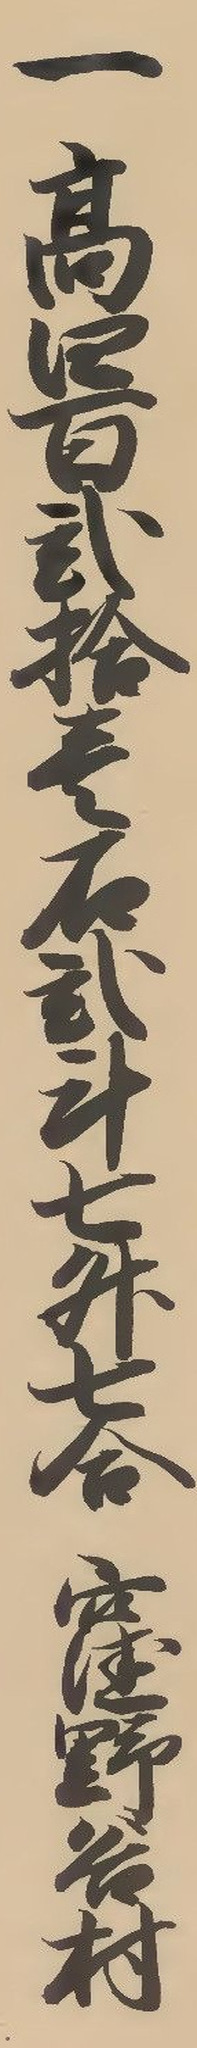一高四百弐拾壱石弐斗七升七合窪野谷村
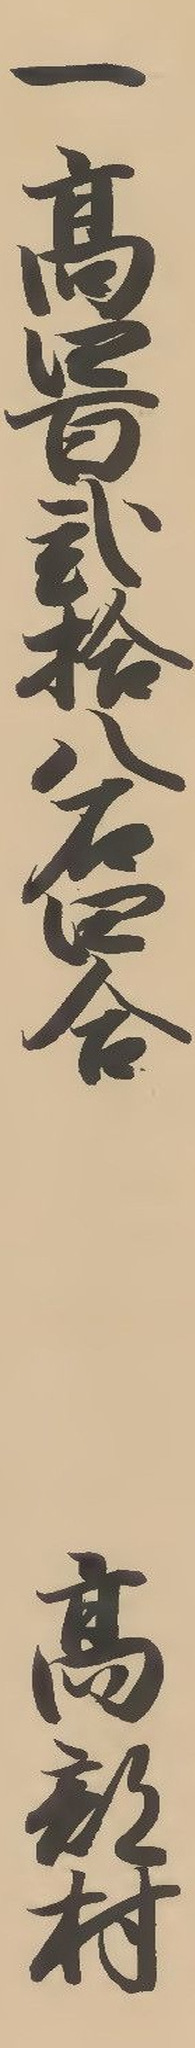一高四百弐拾八石四合高部村
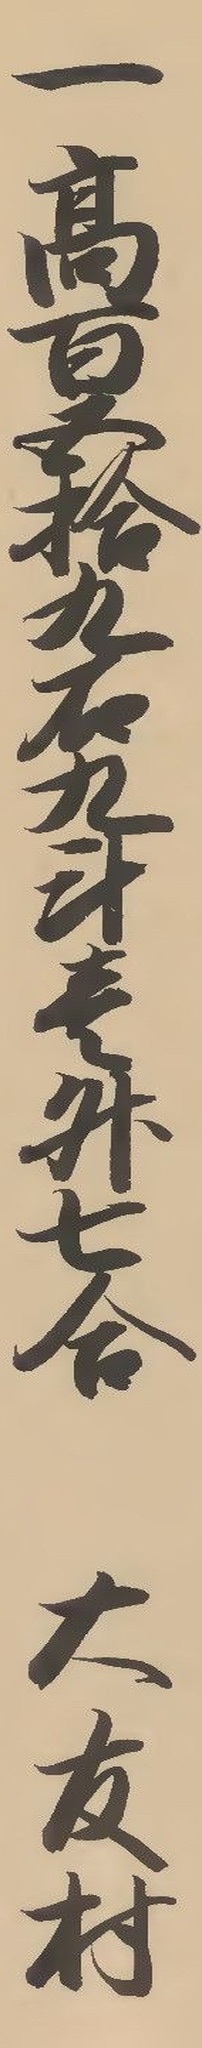一高百五拾九石九斗壱升七合大友村
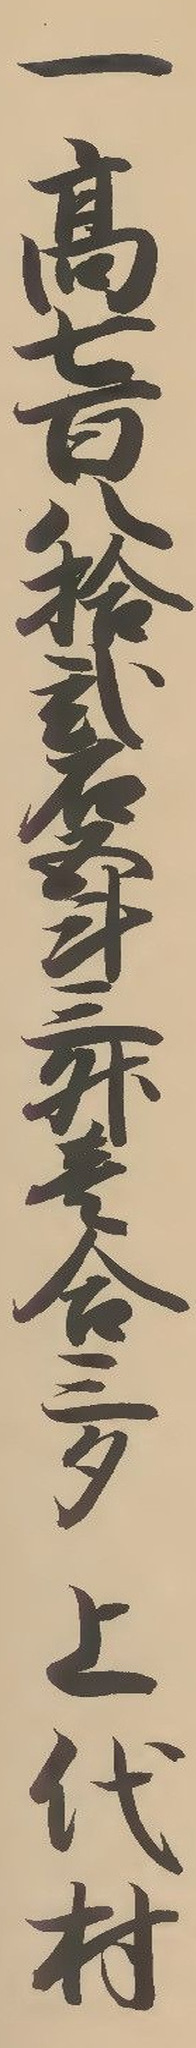一高七百八拾弐石五斗三升壱合三勺上代村
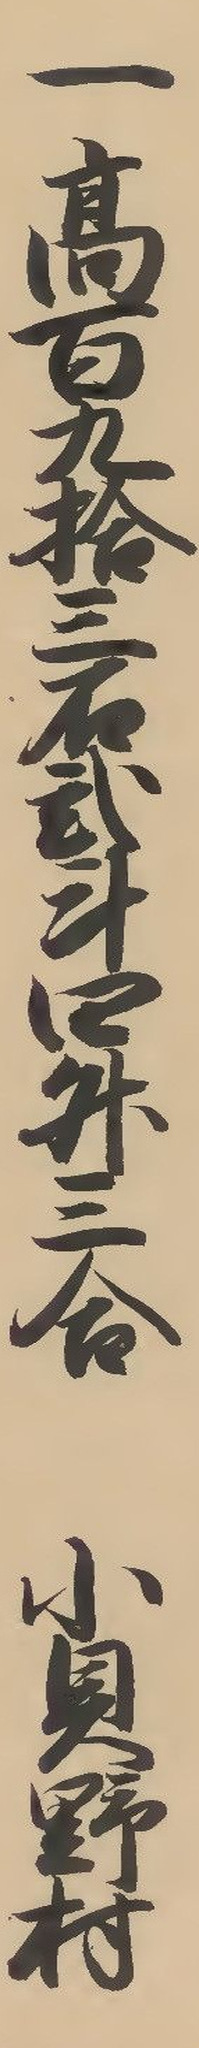一高百九拾三石弐斗四升三合小貝野村

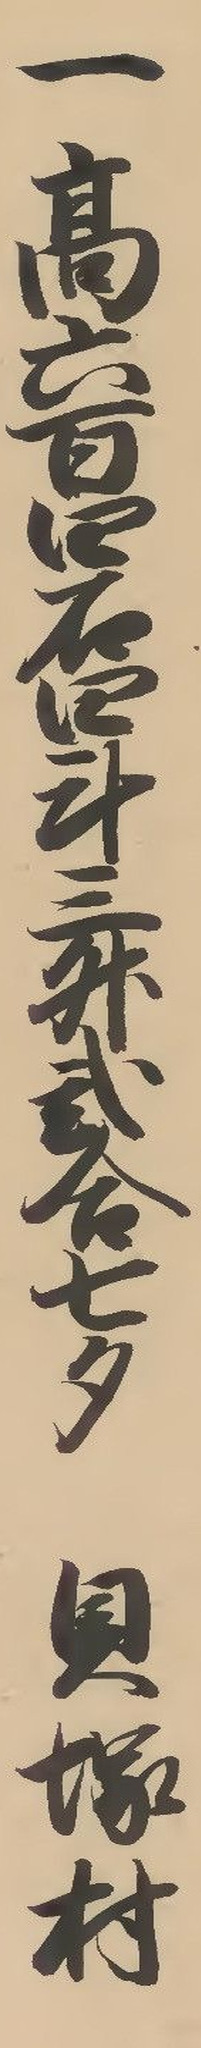一高六百四石四斗三升弐合七勺貝塚村
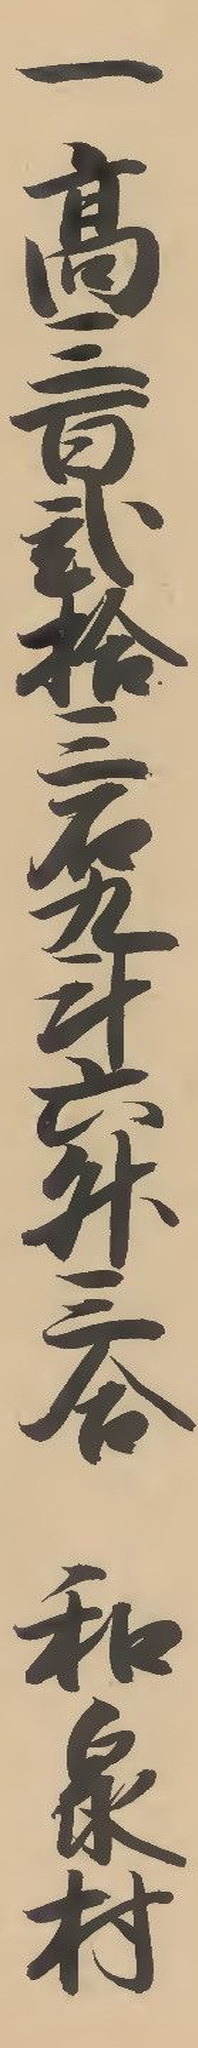一高三百弐拾三石九斗六升三合和泉村
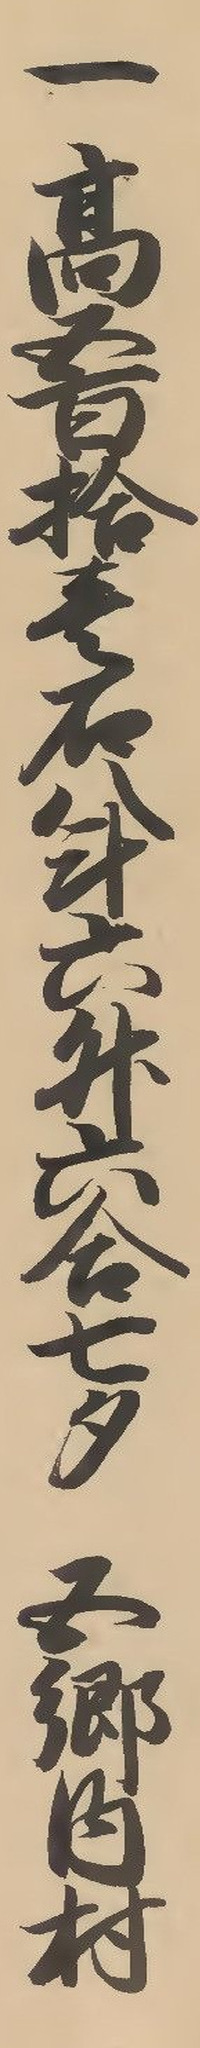一高五百拾壱石八斗六升六合七勺五郷内村
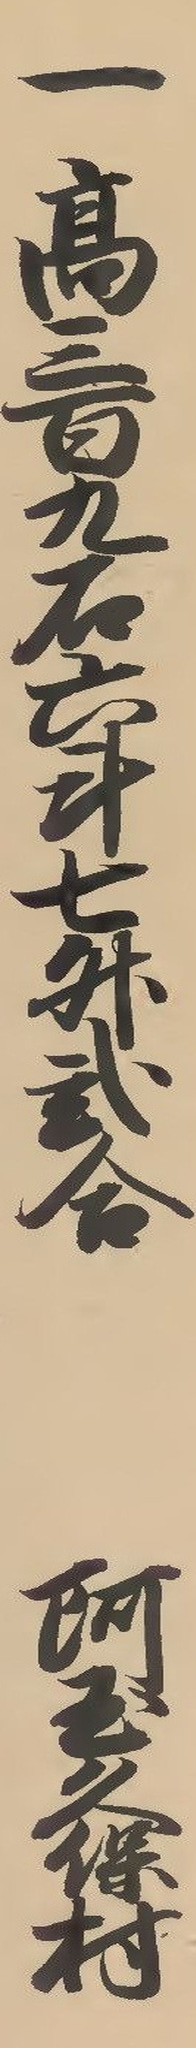一高三百九石六斗七升弐合阿玉久保村
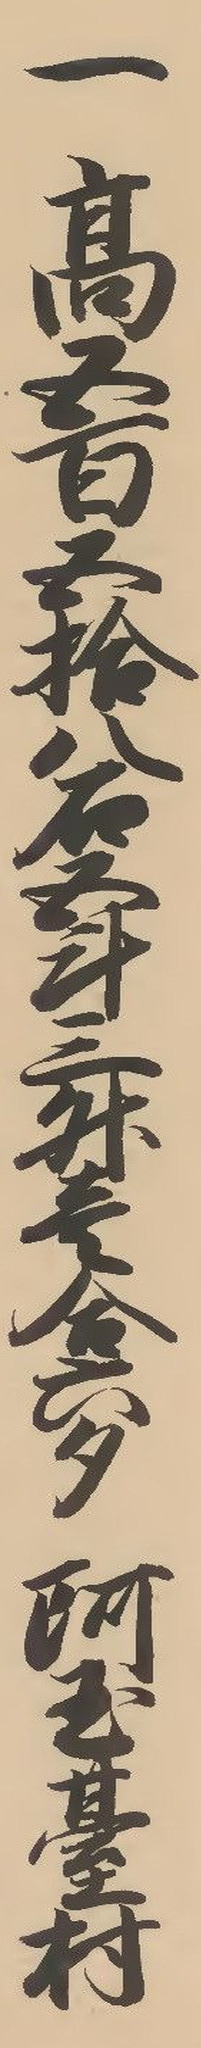一高五百五拾八石五斗三升壱合六勺阿玉台村
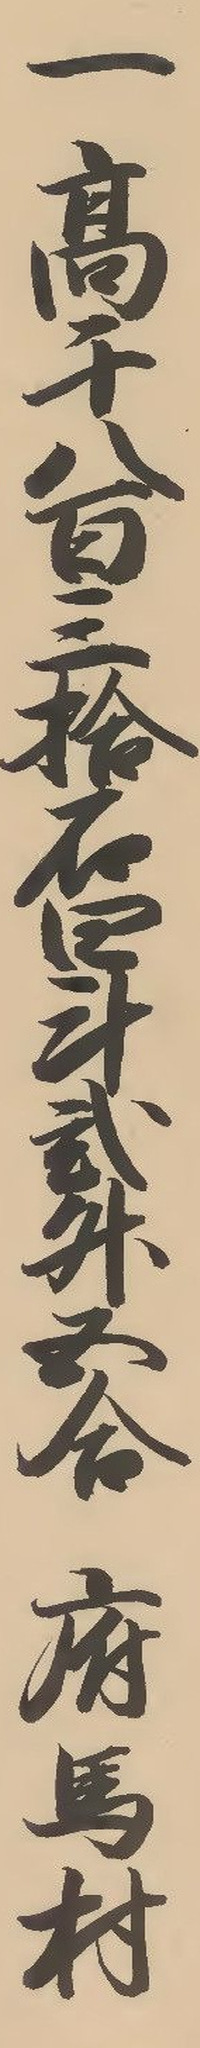一高千八百三拾石四斗弐升五合府馬村
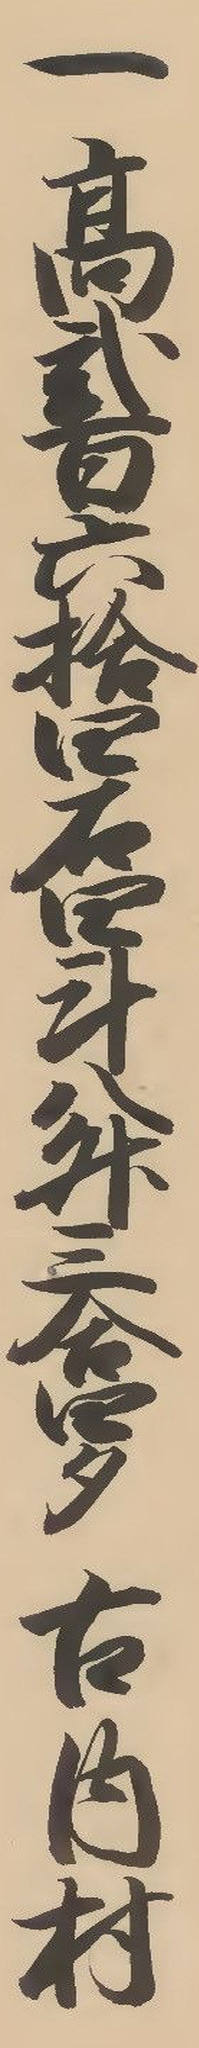一高弐百六拾四石四斗八升三合四勺古内村
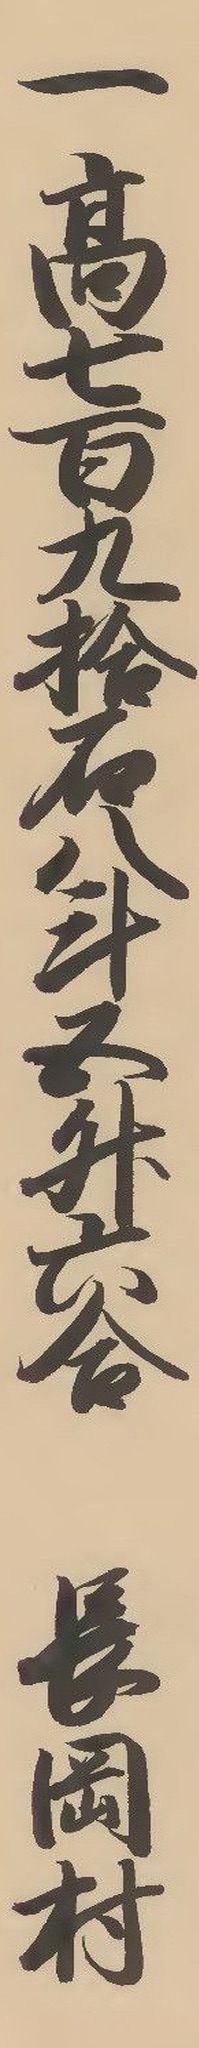一高七百九拾石八斗五升六合長岡村

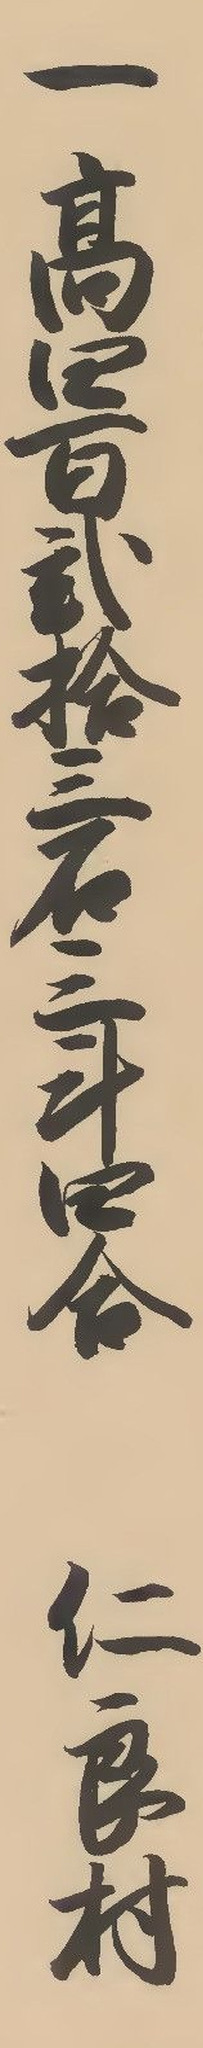一高四百弐拾三石三斗四合仁良村
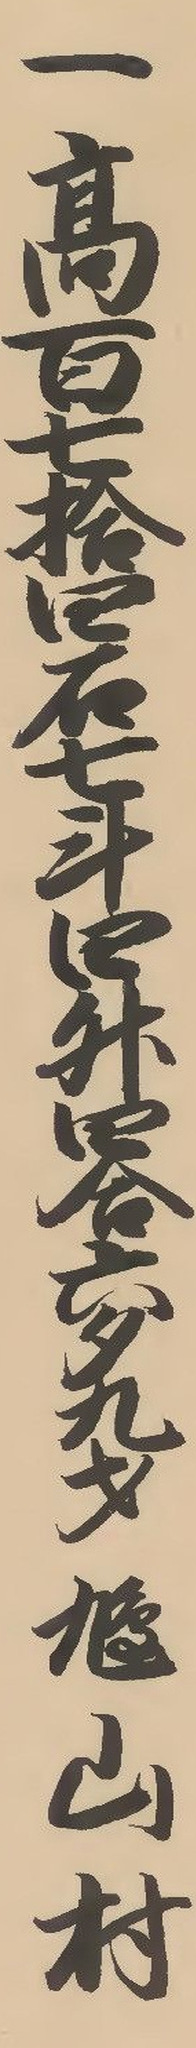一高百七拾四石七斗四升四合六勺九才鳩山村
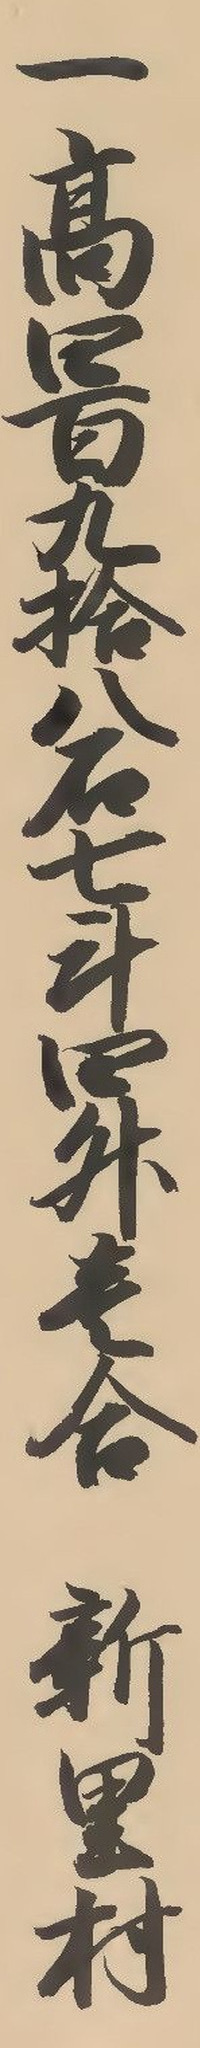一高四百九拾八石七斗四升壱合新里村
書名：下総国郷帳
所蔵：国立公文書館 National Archives of Japan
